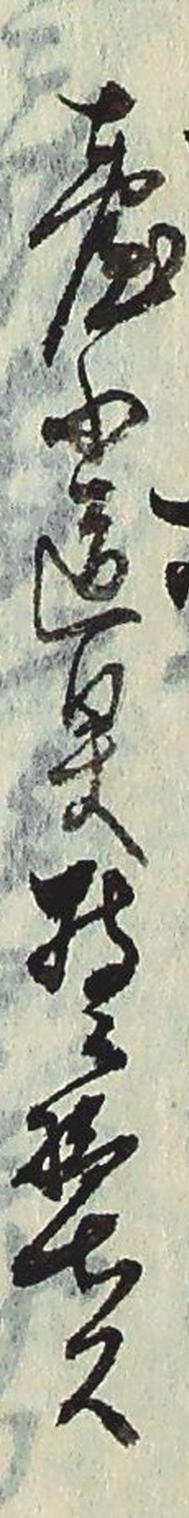台小道具持に指出す
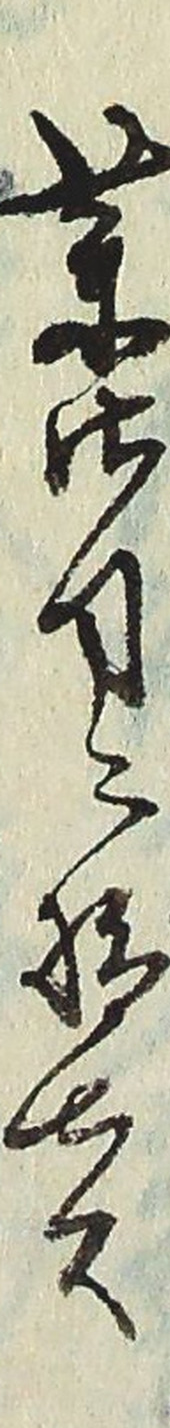薬御用に指出す
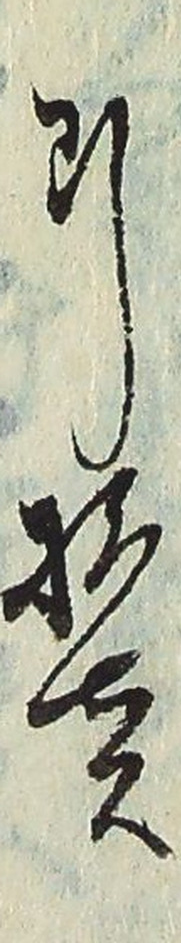に指出す
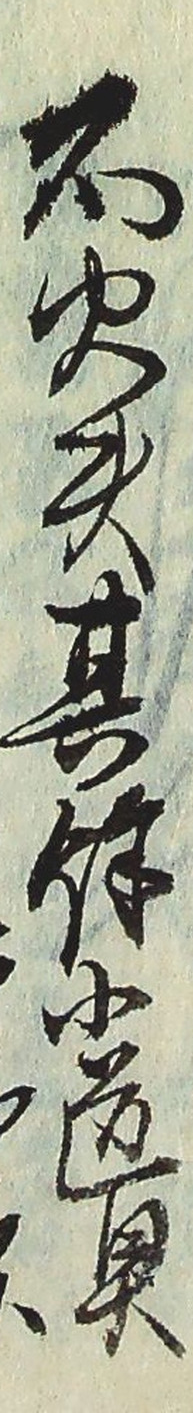石火矢其余小道具
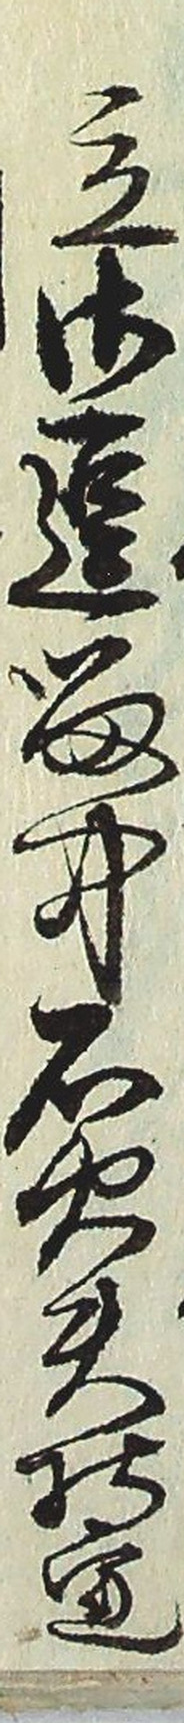立御逗留中石火矢持運
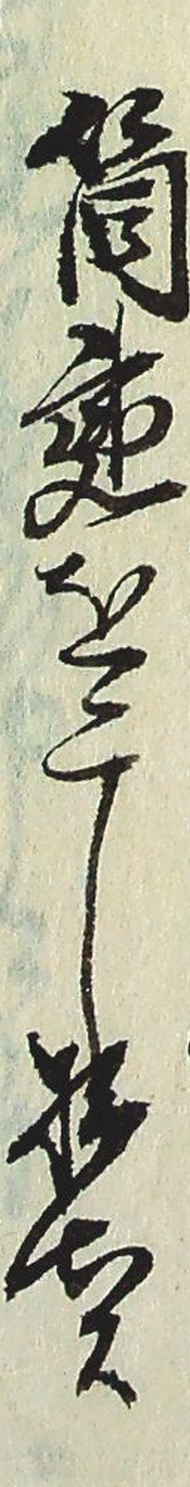筒建をこし指出す
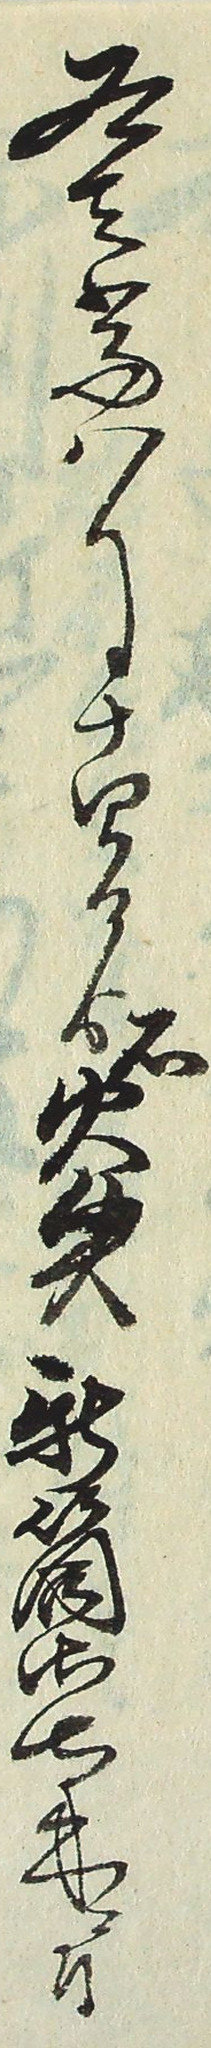右は当八月十四日ゟ石火矢新筒御出来に付
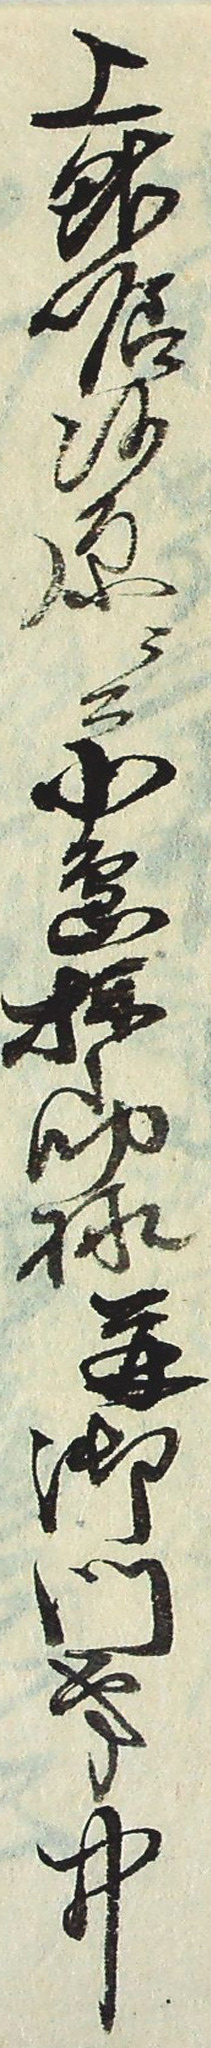上鮎喰河原にて北島棟助様并御門弟中
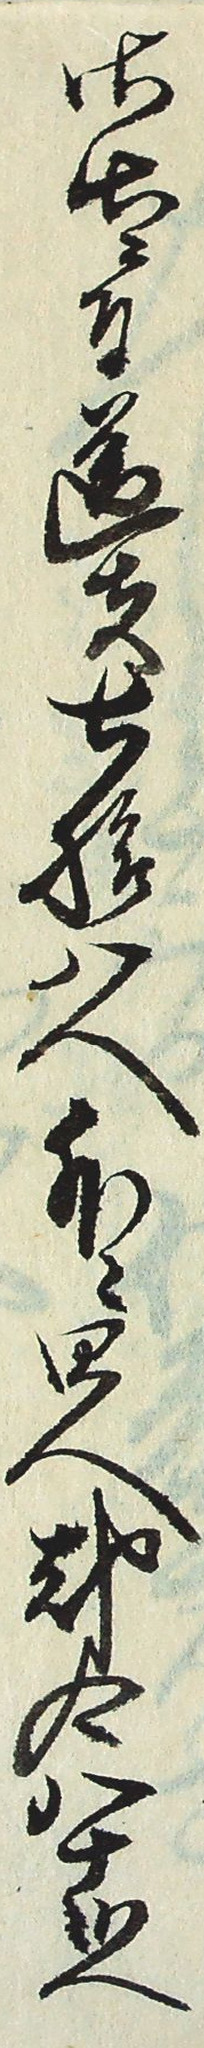御出に付送夫七拾八人外に四人都合八十弐人

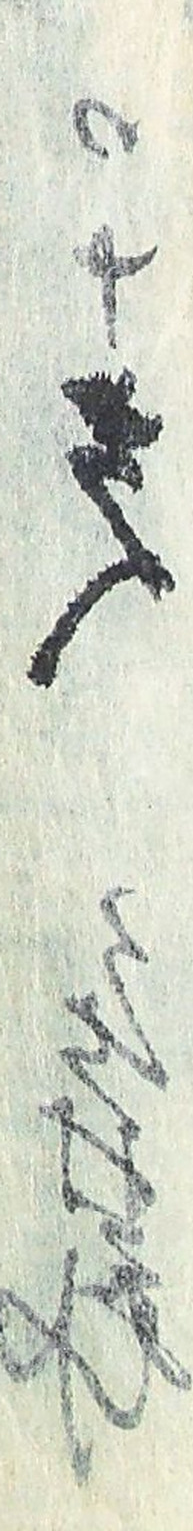子十一月十三日
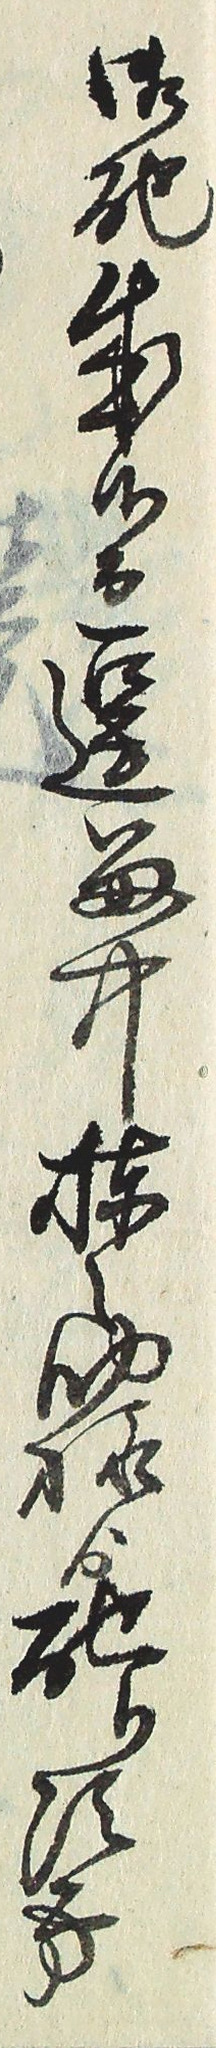御配成候て逗留中棟之助様ゟ配り次第
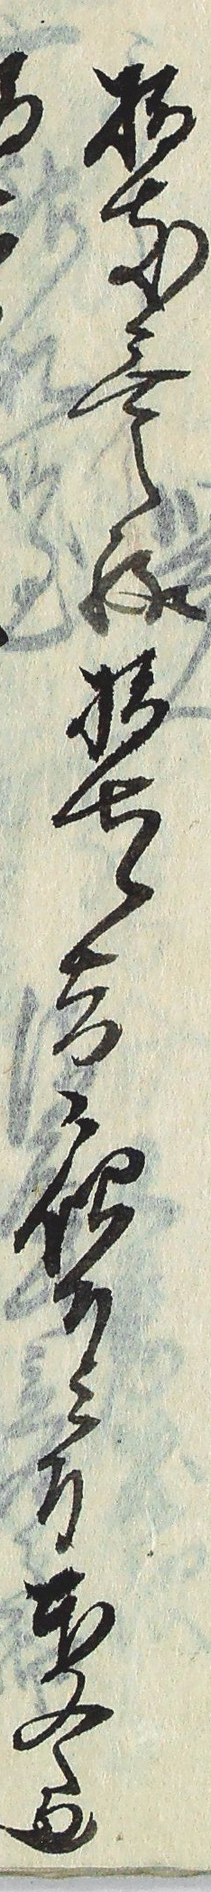指支無之様指出候旨被仰付に付本文之通
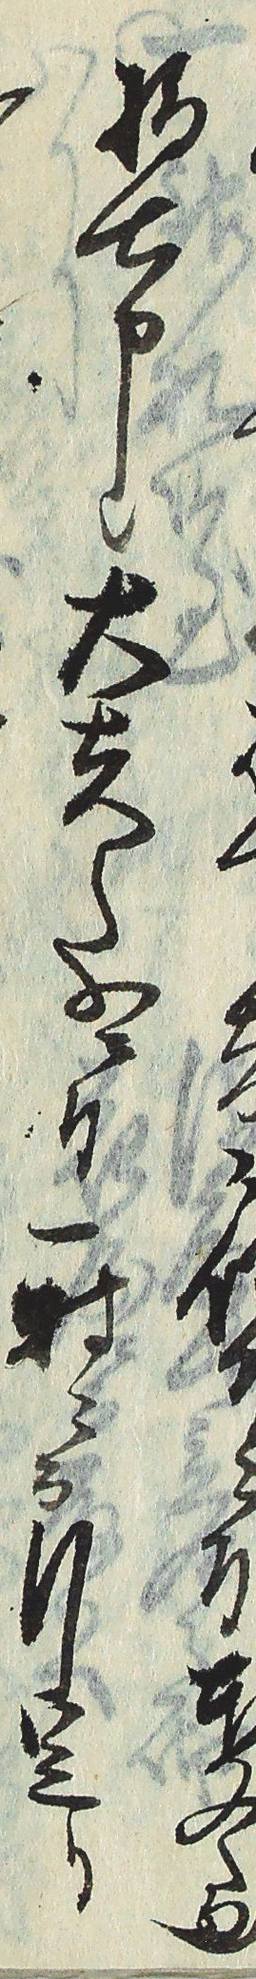指出申候右夫之義に付一村にて引足り
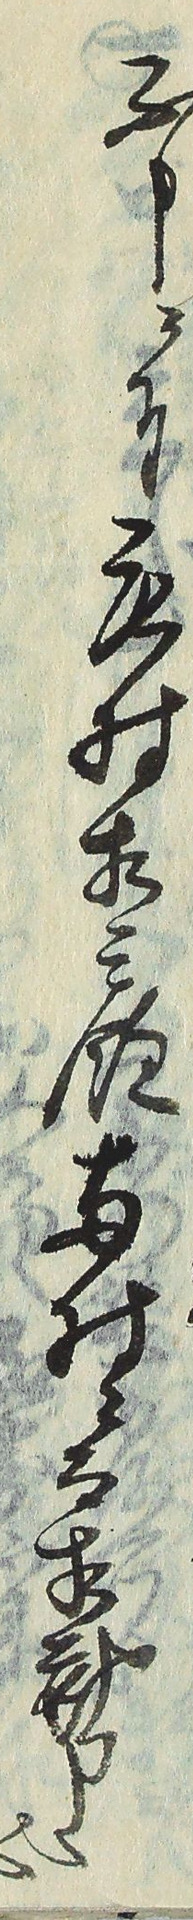不申に付庄村相雇両村にて相当り申候以上
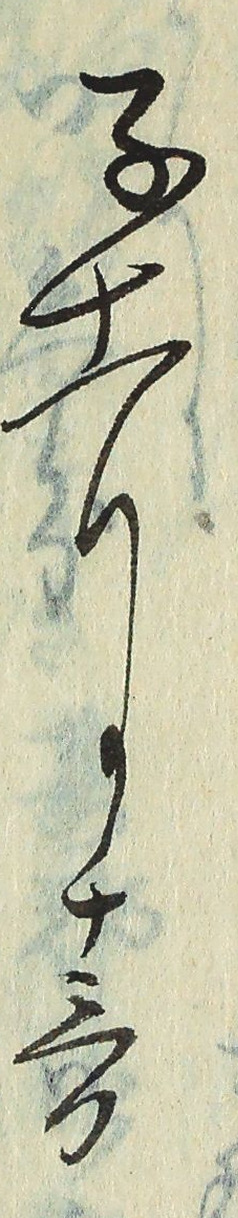子十一月十三日
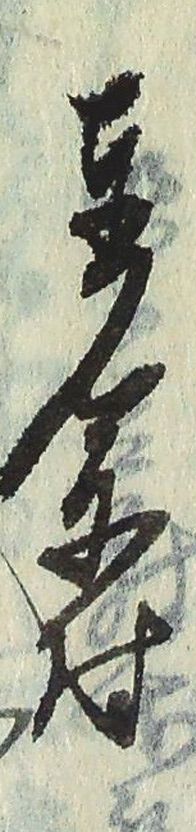東名東村
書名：名東郡中諸割賦元帳
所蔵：鳴門教育大学 Naruto University of Education
